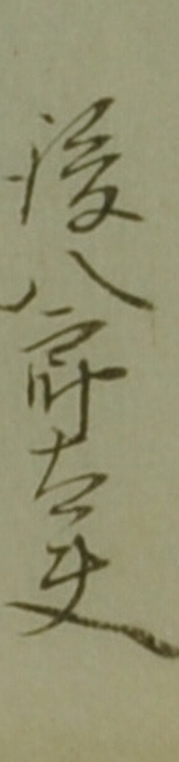後八郎太夫
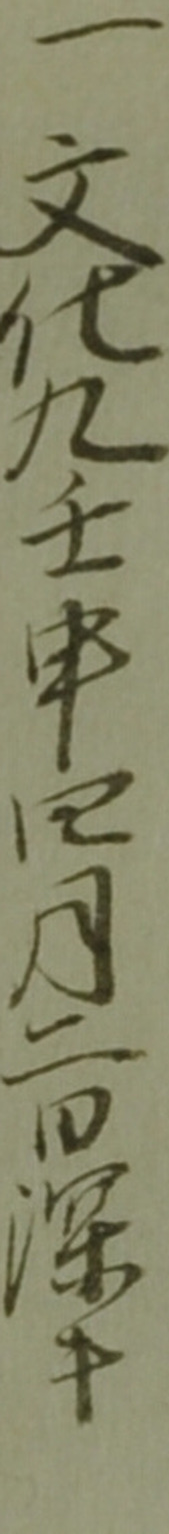一文化九壬申四月二日深
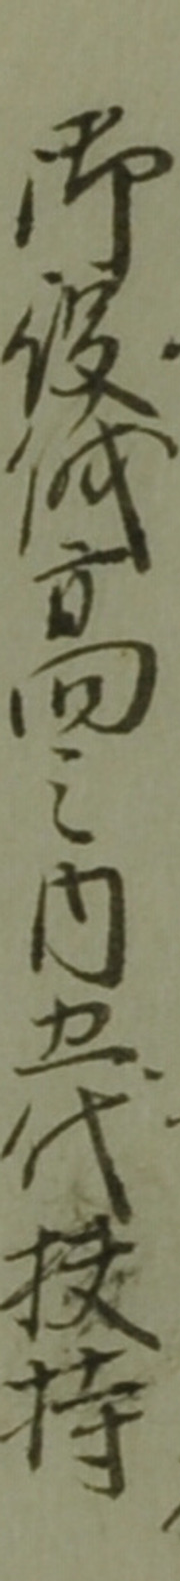御役儀高之内五代扶持
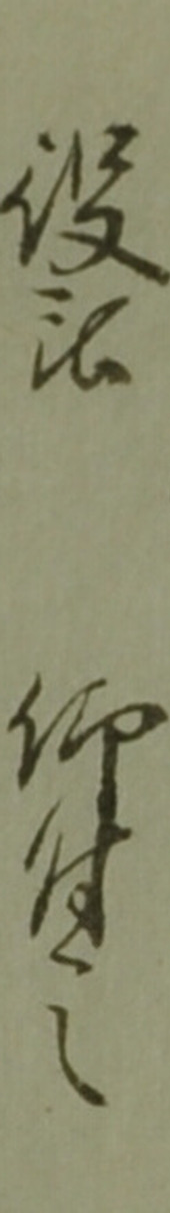役被仰付之
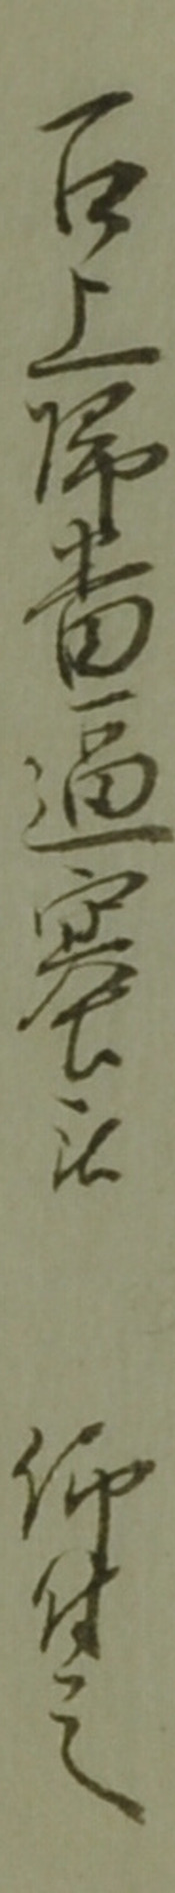召上帰番逼塞被仰付之
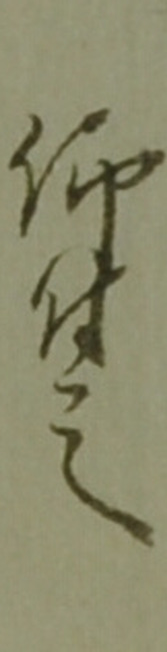仰付之
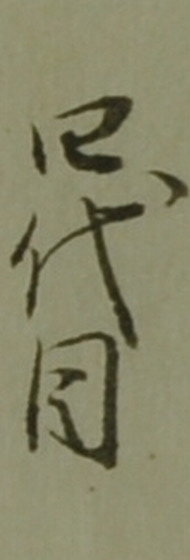四代目
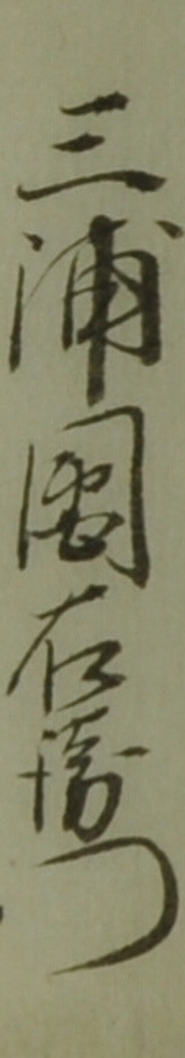三浦団右衛門

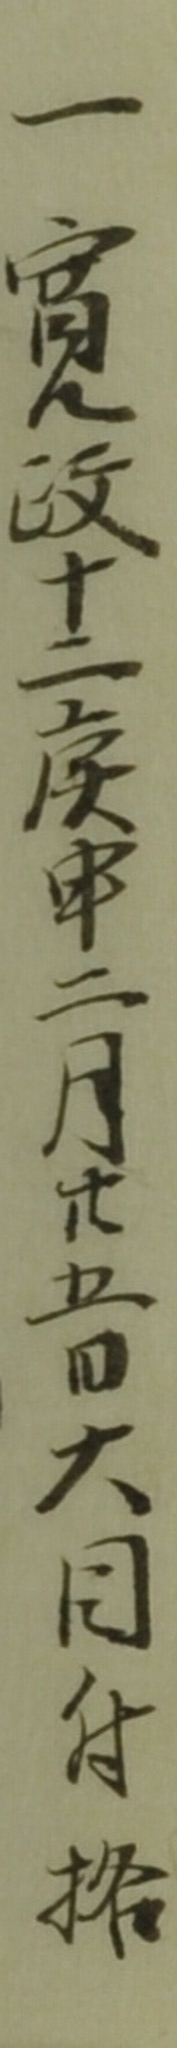一寛政十二庚申二月廿五日大目付格
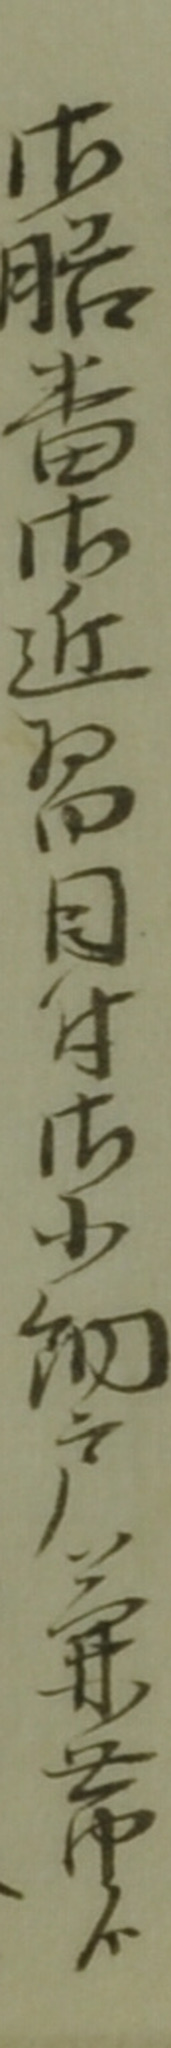御膳番御近習目付御小納戸兼帯ゟ
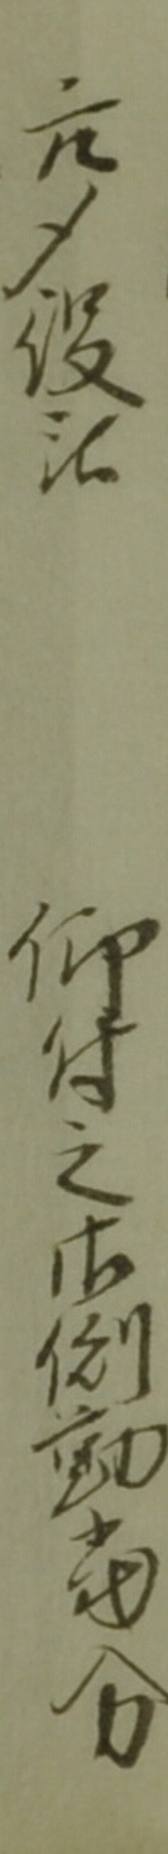元〆役被仰付之御側勤当分
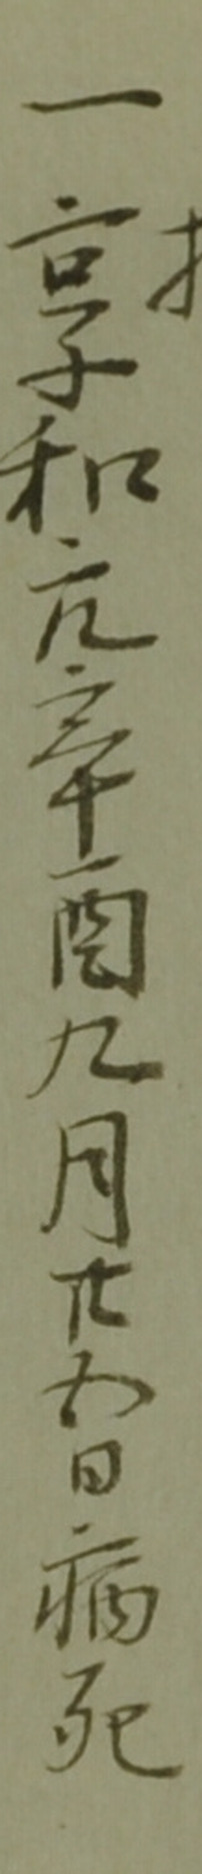一享和元辛酉九月廿五日病死
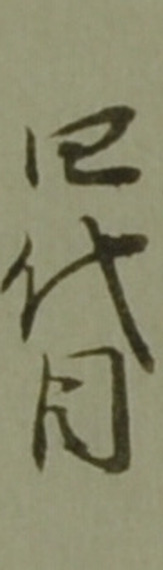四代目
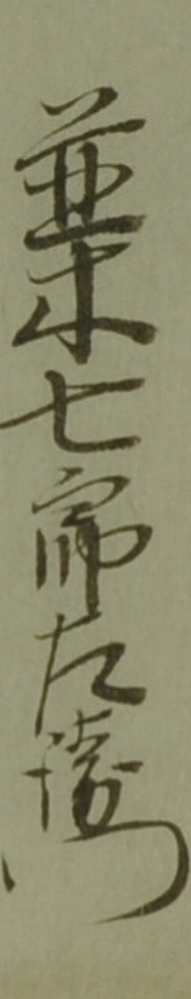並木七郎左衛門
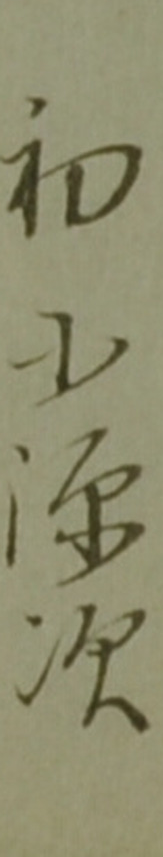初小源次
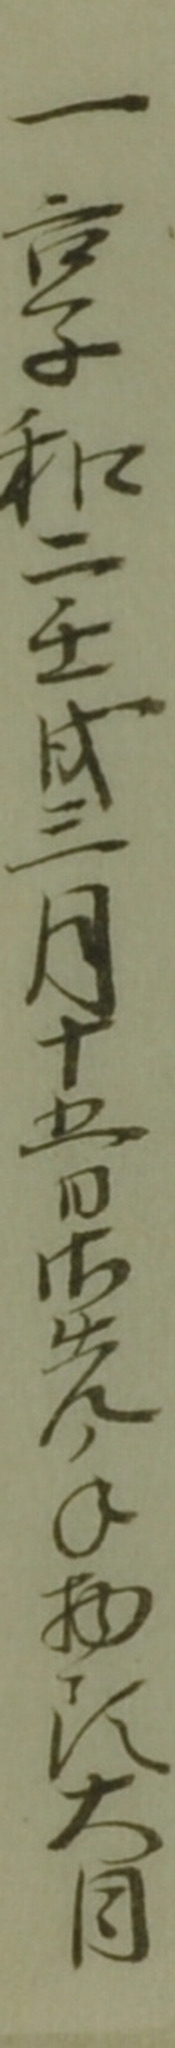一享和二壬戌三月十五日御先手物頭大目
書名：諸御役代々録（七）
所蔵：伊那市立高遠町図書館・合同会社AMANE
